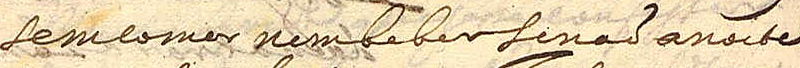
sem comer nem beber senaõ a noite
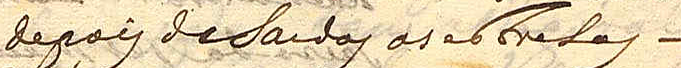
depois de Saidas as estrelas
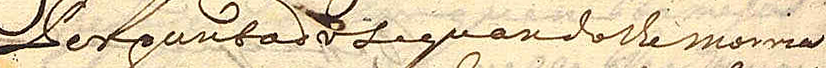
Perguntado se quando lhe morria
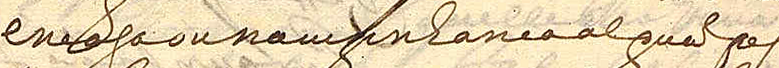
en casa ou na uizinhanca alguā pes
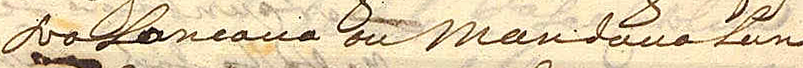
soa Lancaua ou mandaua lan
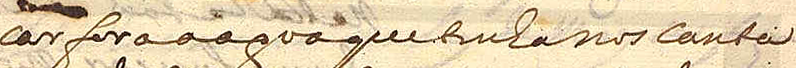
car fora a agoa que tinha nos canta
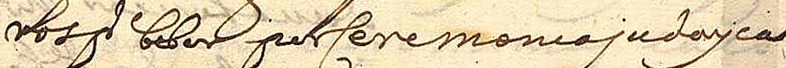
ros pa beber por Ceremonia judayca
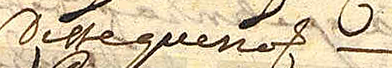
Disse que naõ
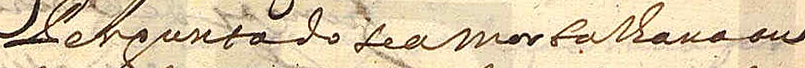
Perguntado se amortalhaua ou
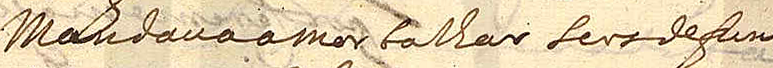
Mandaua amortalhar seos defun
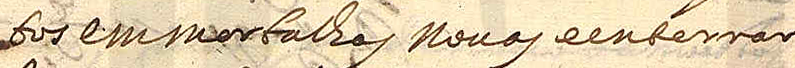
tos em mortalhas nouas e enterrar
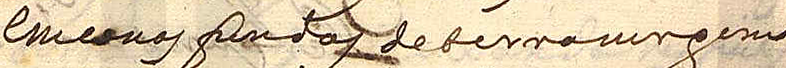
em couas fundas de terra uirgem
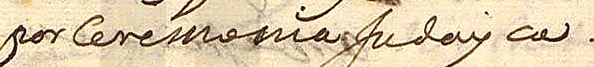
por ceremonia Judayca
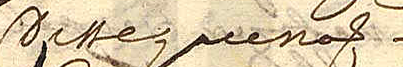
Disse que naõ
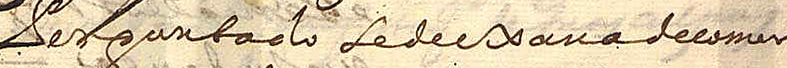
Perguntado se deixaua de comer
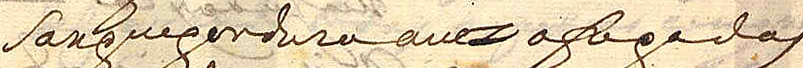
sangue gordura auez afogadas
